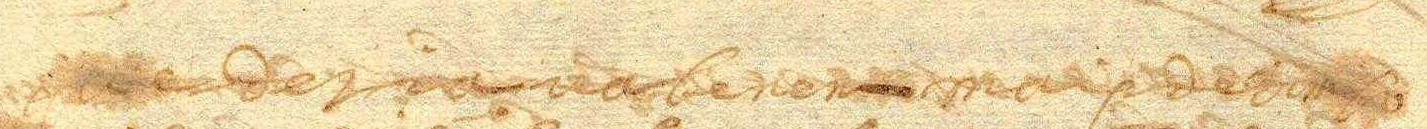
que dezia ualerem mais de simCo
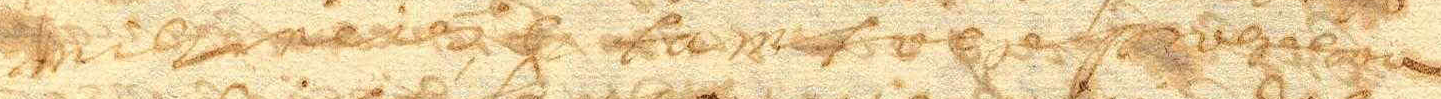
mil reis, E tamto se prosesou
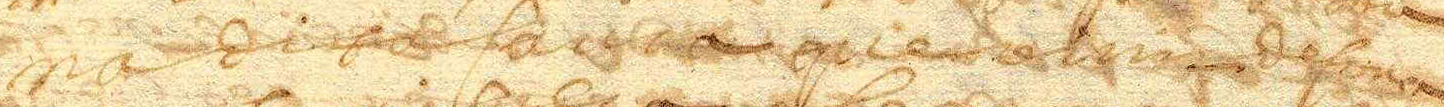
na dita Cauza que o iuiz de fora
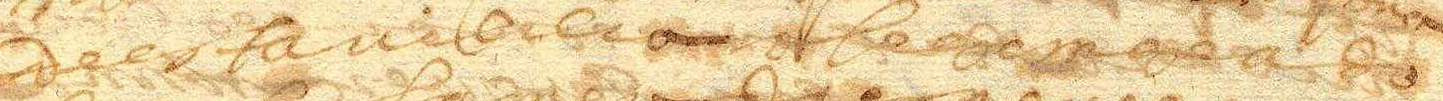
desta uilla o lesemseado
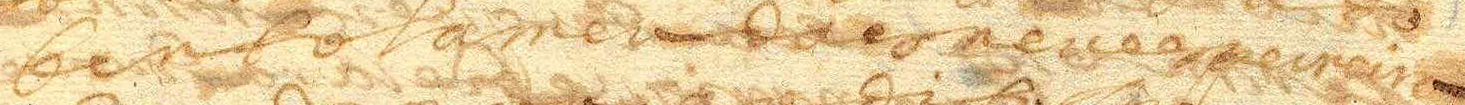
bertolameu das neues pereira
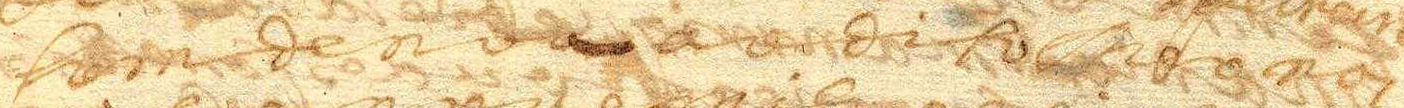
Comdenou ao dito Reo nos
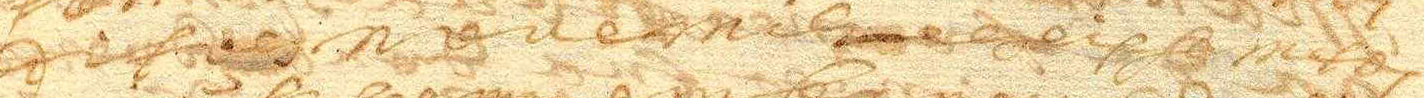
ditos noue mil e seissemtos
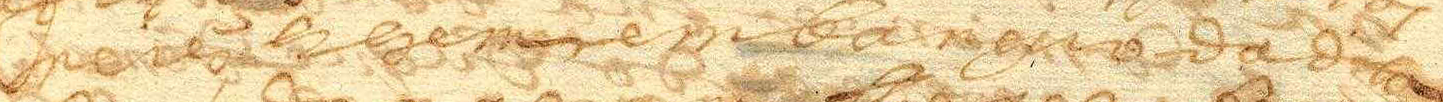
reis, E sem embarguo da dita
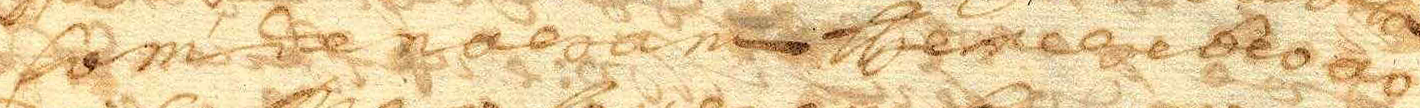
Comdenasam lhe resebeo ao
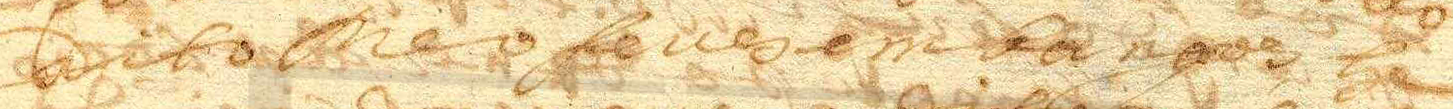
dito Reo seus embargos, he
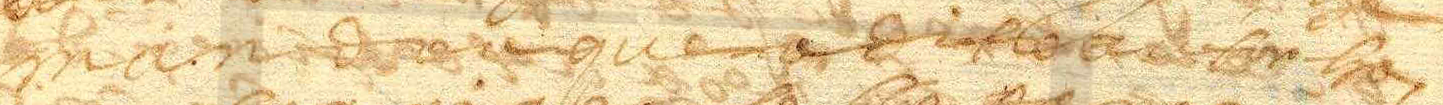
mandou que o dito autor hos
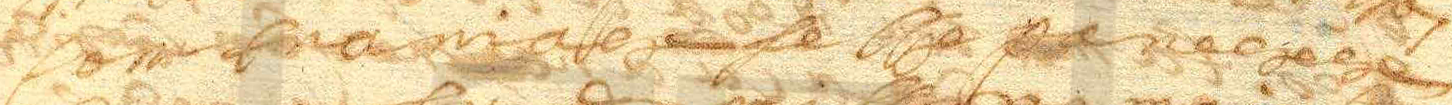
Comtrariase se lhe paresese,
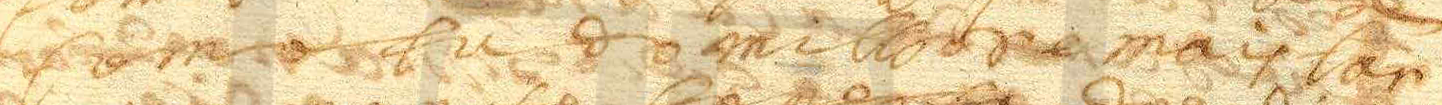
Como tudo milhor e mais lar
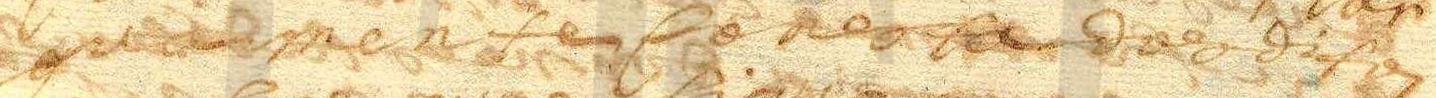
guamente Consta dos ditos
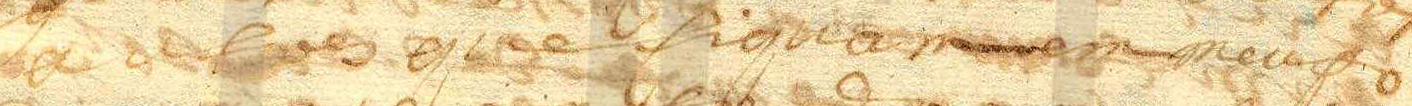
autos que fiquam em meu po
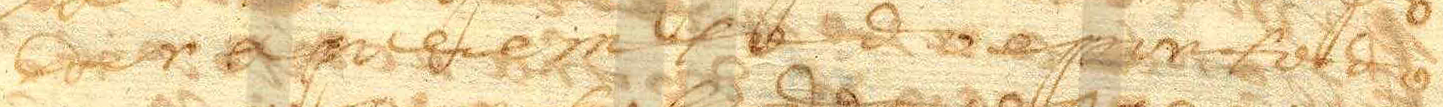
der a que em todo e por todo
